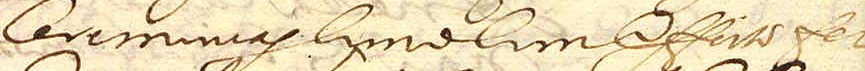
Ceremonias Como Com Effeito fez
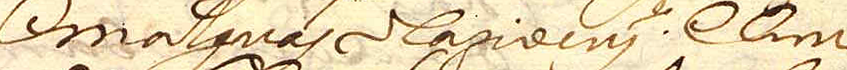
Em alguas ocazioeñs. E Com
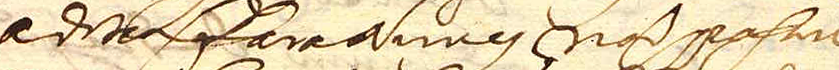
a dita Clara Nunes naõ passou
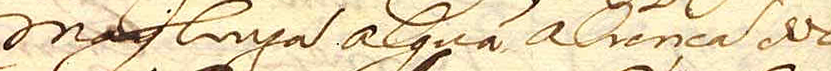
mais Couza alguā a Crença dos
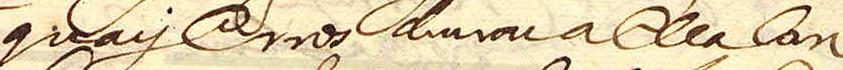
quais Erros durou a Ella Con
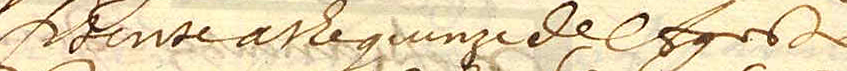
fitente athe quinze de Agosto
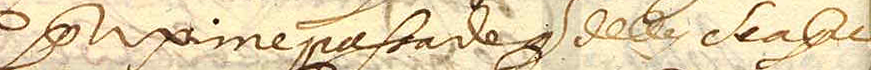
proxime passado q̄ delles se apre
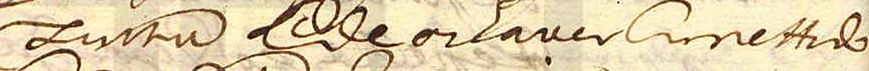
zentou E de os haver Comettido
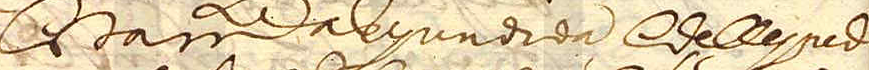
Esta mto aRependida E delles ped
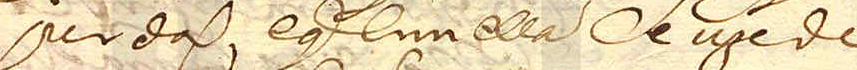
perdaõ, e q̄ Em ella Se uze de
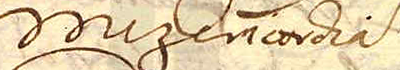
mizericordia
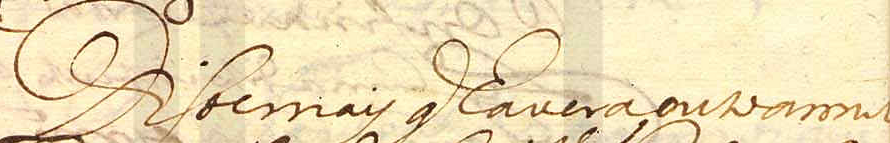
Disse mais q̄ havera outo annos
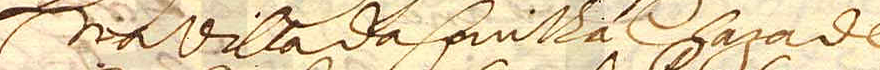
na Villa da Covilhã E Caza de
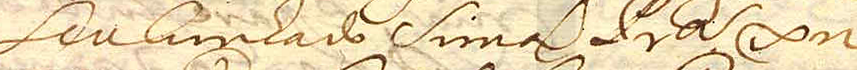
Seu Cunhado Simaõ Pra. xn
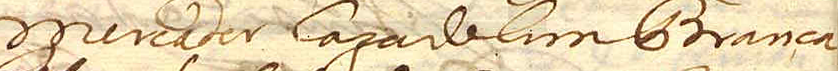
mercador Cazado Com Branca
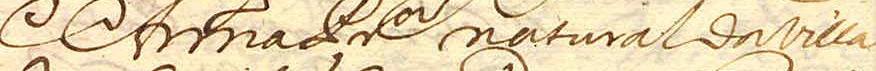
E Anna Pra natural da villa
